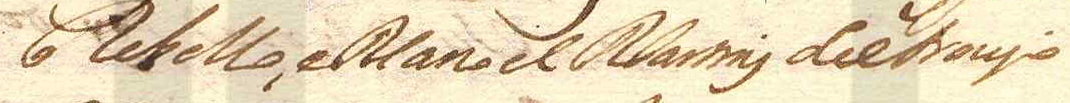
Rebello e Manoel Martins de Araujo
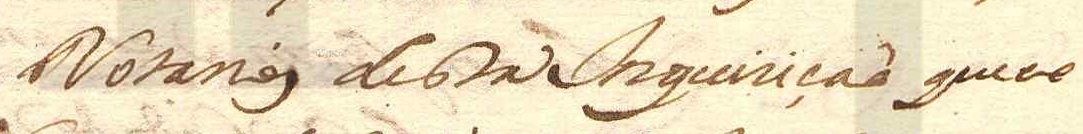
Notarios desta Inquiziçaõ que ex
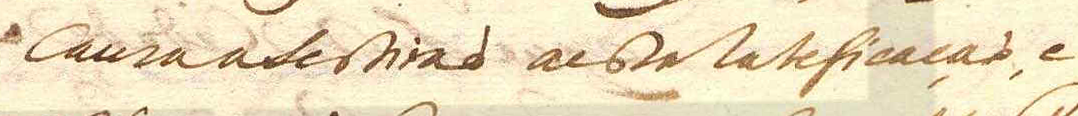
cauza asestiraõ a esta Rateficaçaõ, e
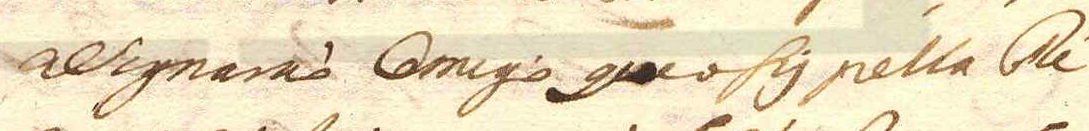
asignaraõ Comigo que o fis pella Ré
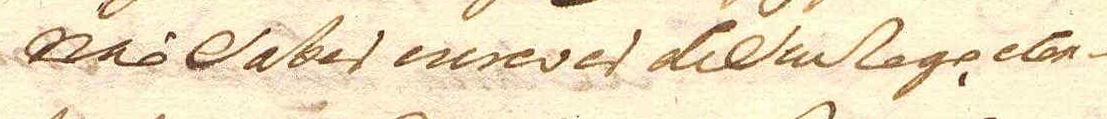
naõ saber escrever de seu Rogo, e con
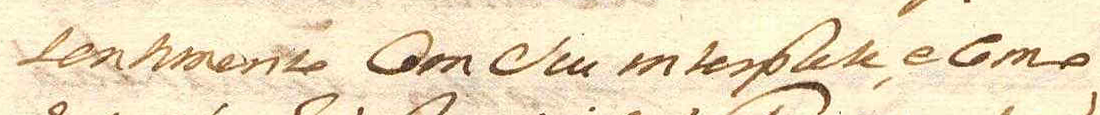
sentimento Com seu interpRete, e com o
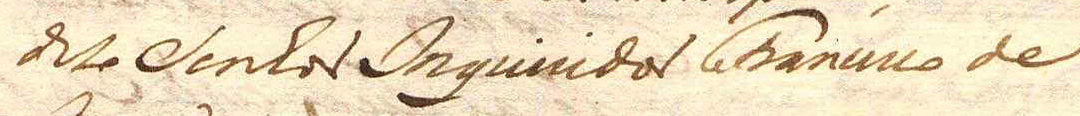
dito Senhor Inquizidor Francisco de
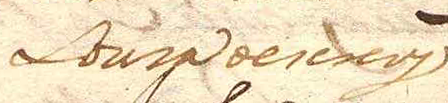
Souza o escrevj
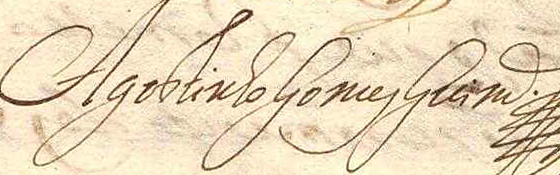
Agostinho Gomes Guim.es
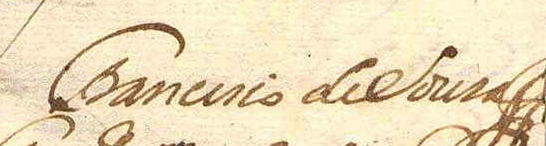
Francisco de Souza
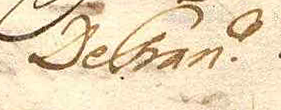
De Fran.co
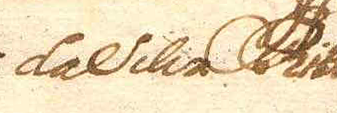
da Silva Rib
